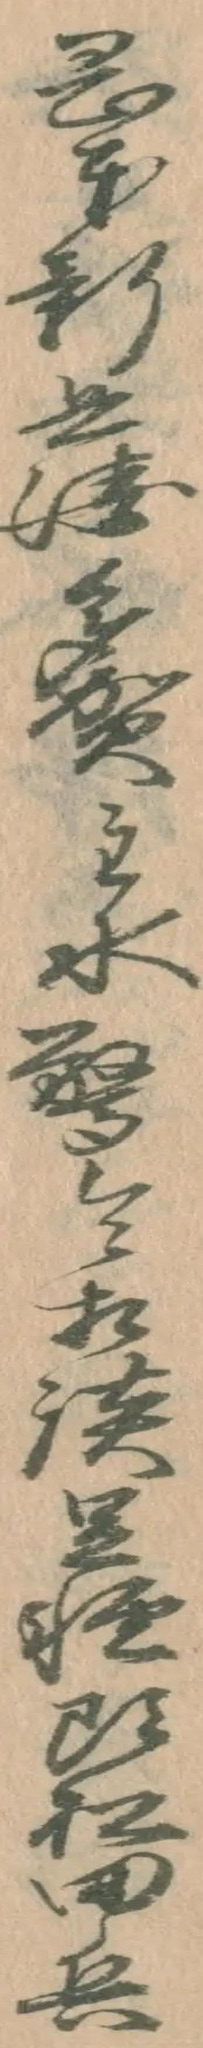岡本新兵衛多賀主水驚今相談足軽頭松田兵
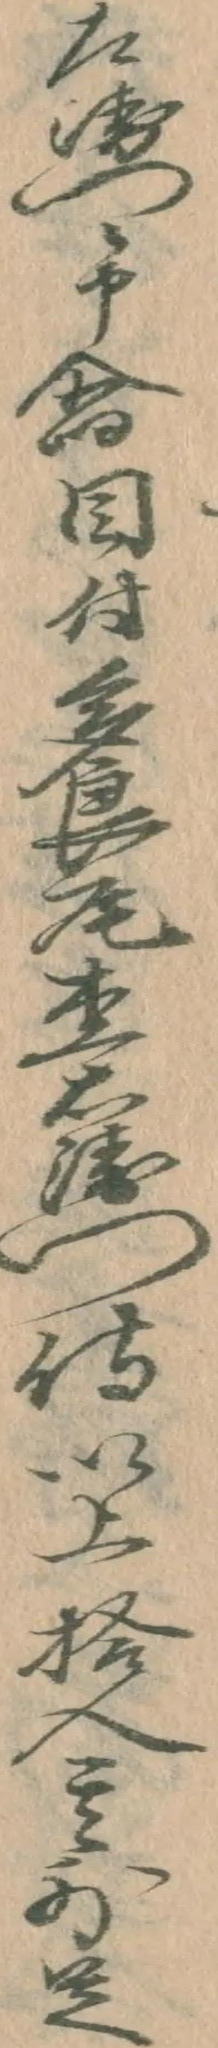左衛門に申会目付多良尾杢右衛門侍以上拾人其外足
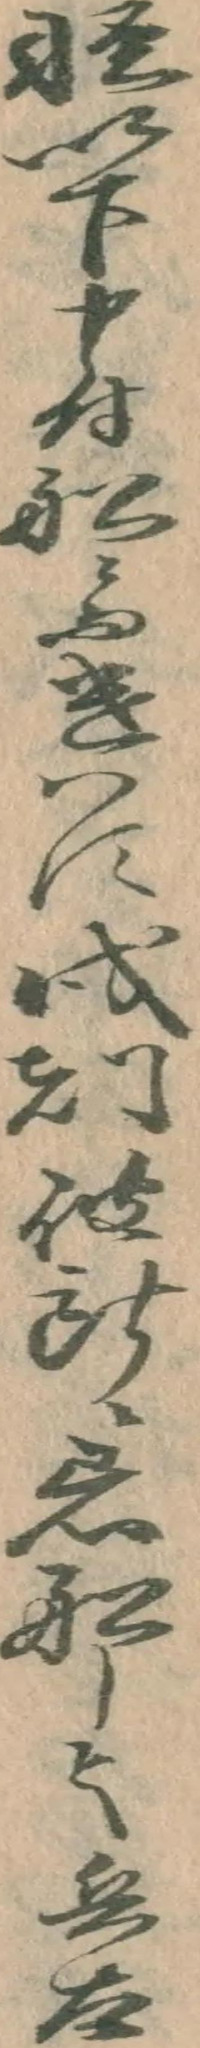軽以下申付船に而遣はす戌刻彼所に着船して兵左
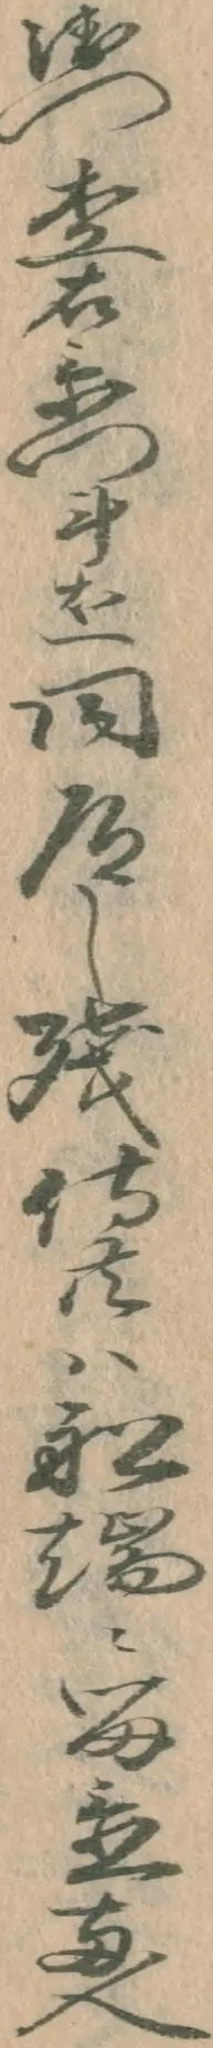衛門杢右衛門斗を同道し残侍共は船端に留置両人
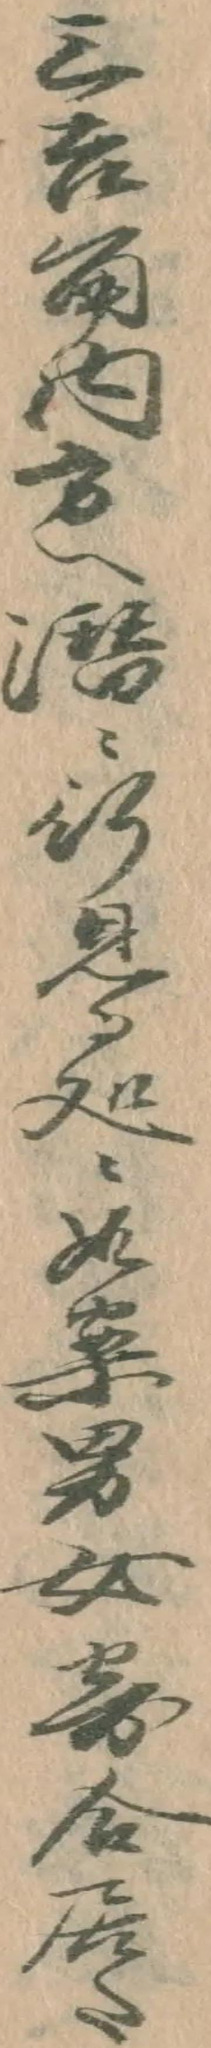三吉角内方へ潜に行見る処に如案男女寄合居た
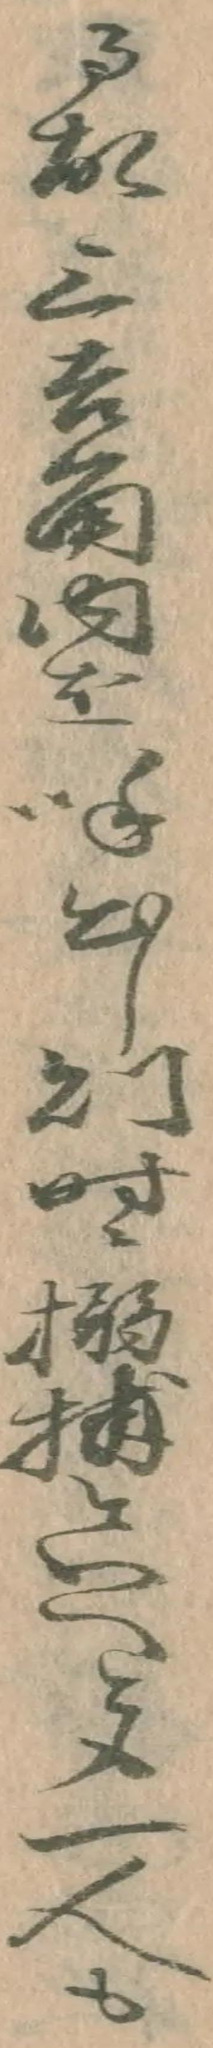る故三吉角内を呼出し則時に搦捕といへとも一人も
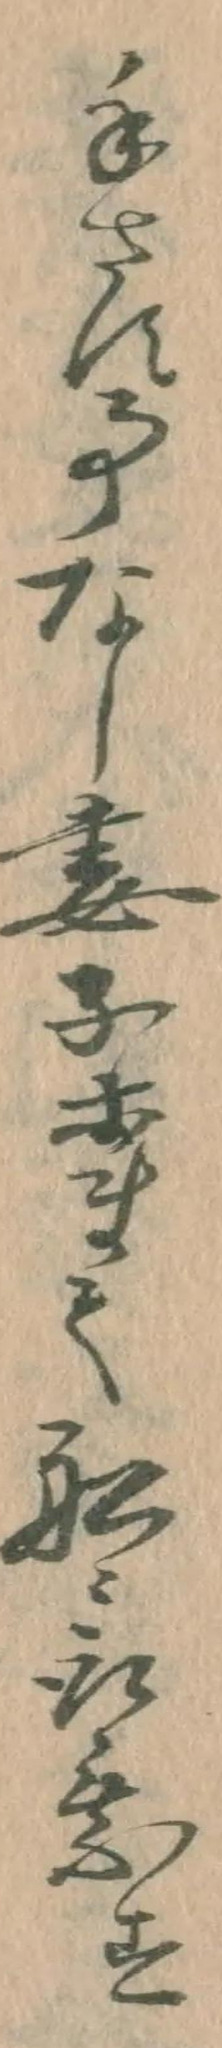手さす事なし妻子等まて船に取乗す
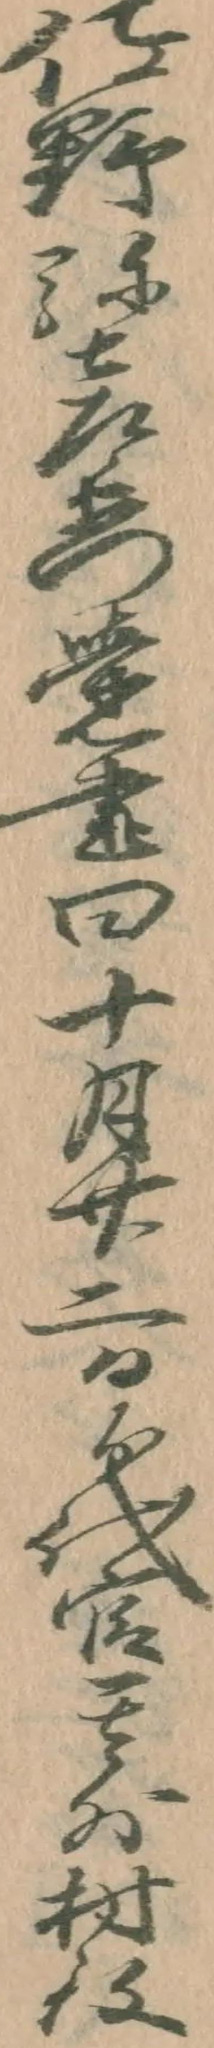佐野弥七左衛門覚書日十月廿二日ゟ代官其外村役
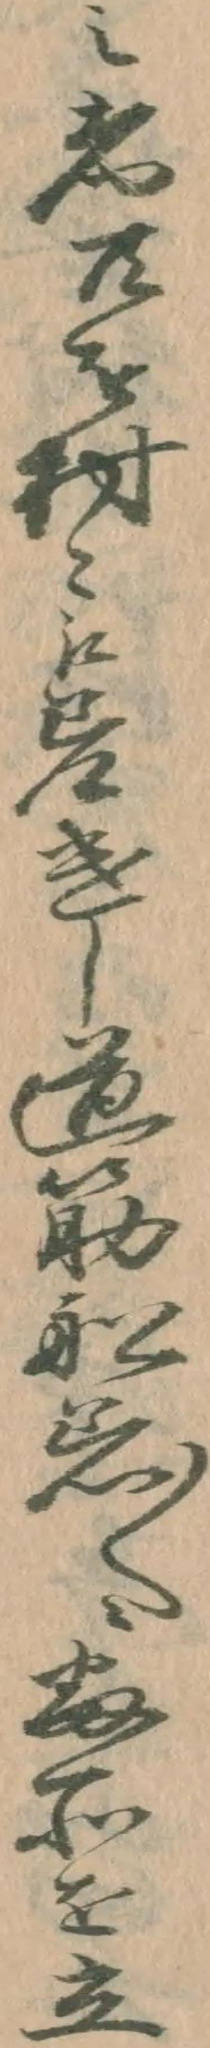之者共を村々え差遣し道筋船着〳〵に番所を立
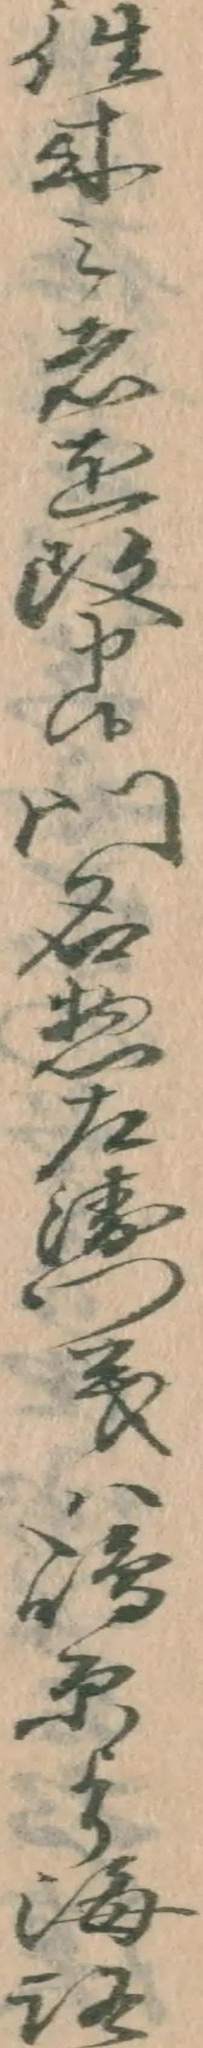往来之者を改申候門名惣左衛門義は島原より海路
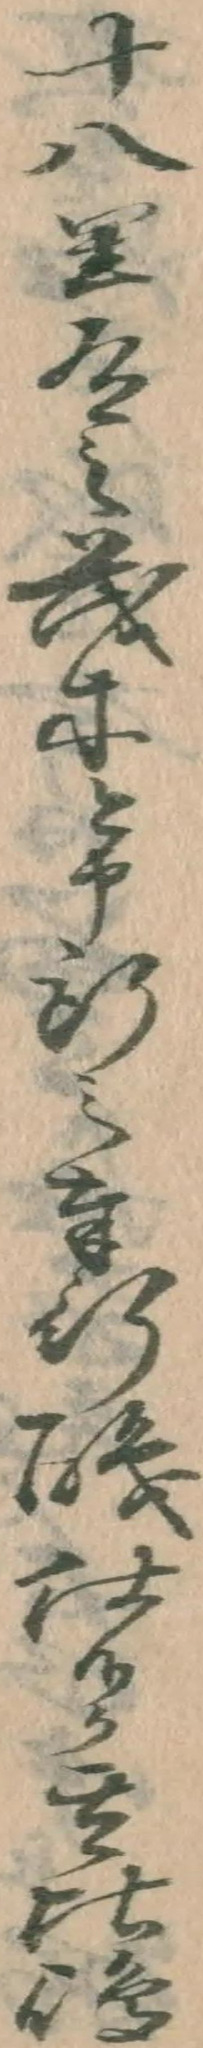十八里有之茂木と申所之奉行職仕候か其比島
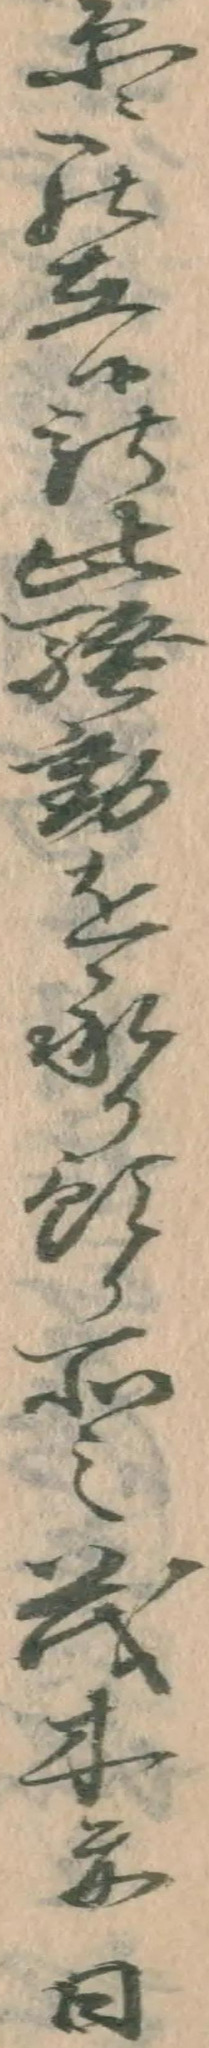原に罷在候所此騒動を承り預り所之茂木并日
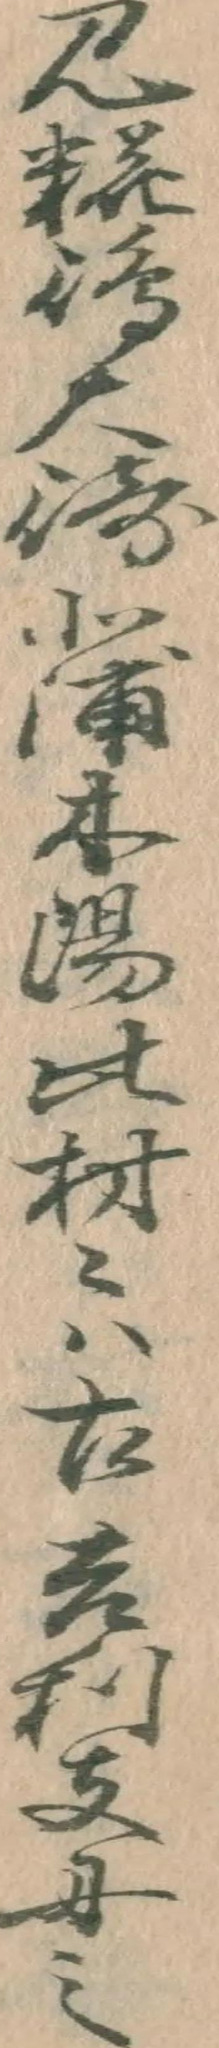見糀島大崎北浦木陽此村々は古吉利支丹之
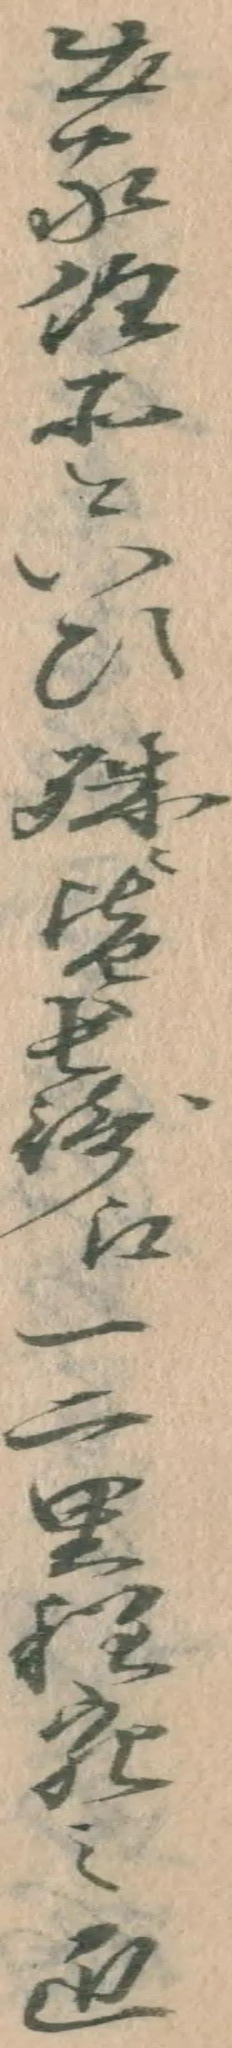出家住所といひ殊に皆長崎え一二里程宛之近
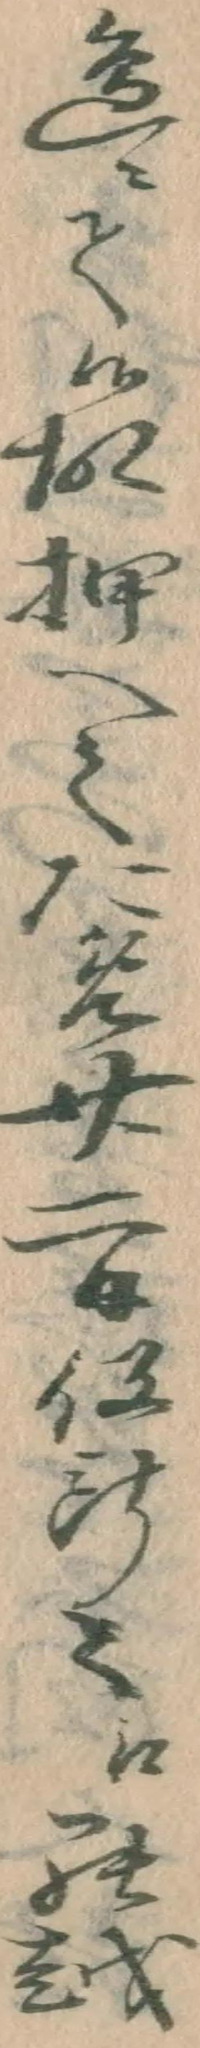辺にて候故押へてため廿二日役所てえ罷越
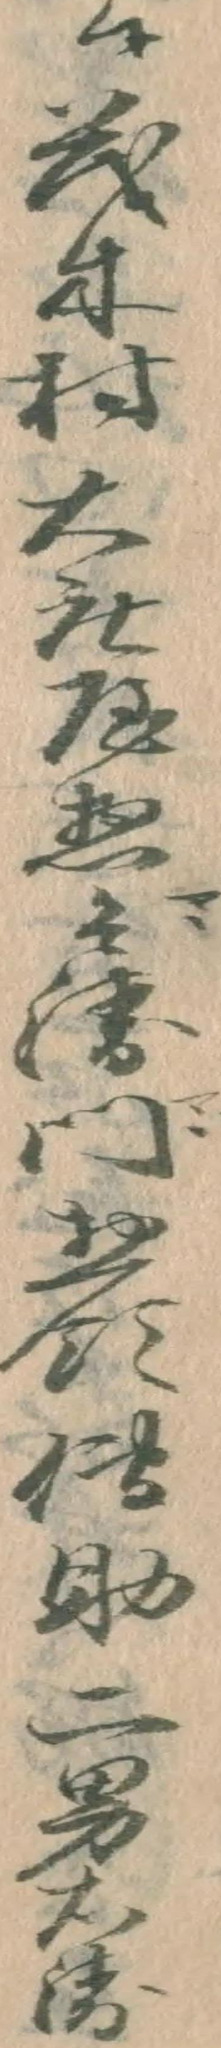候茂木村大庄屋惣兵衛門惣領伝助二男右衛
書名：切支丹御退治記 49巻. [1]
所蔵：国立国会図書館 National Diet Library, JAPAN
